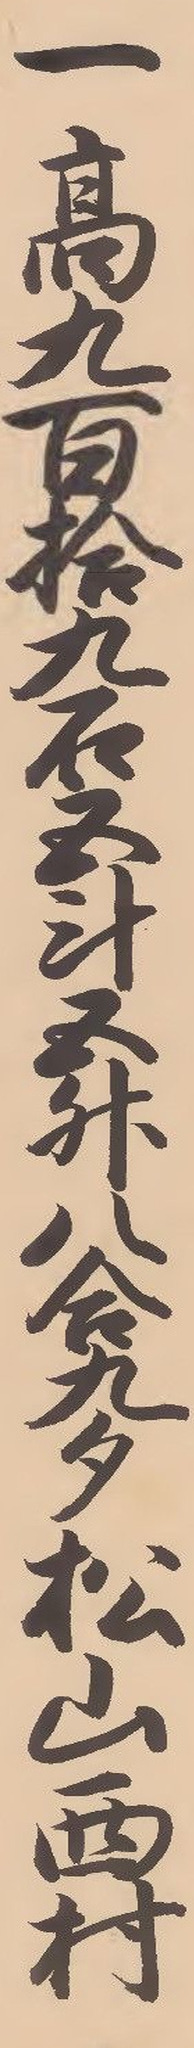一高九百拾九石五斗五升八合九勺松山西村
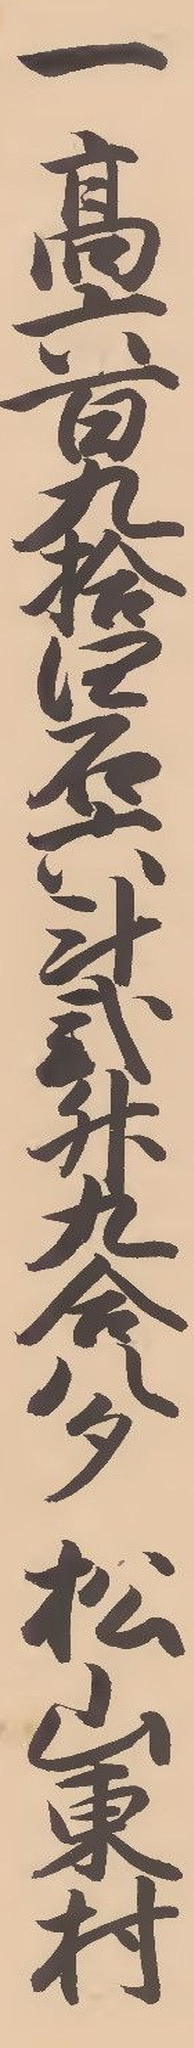一高六百九拾四石六斗弐升九合八勺松山東村

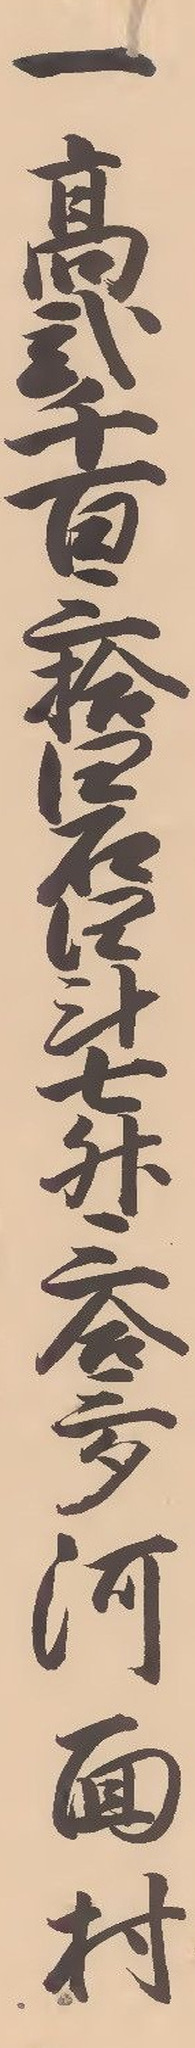一高弐千百三拾四石四斗七升三合三勺河面村
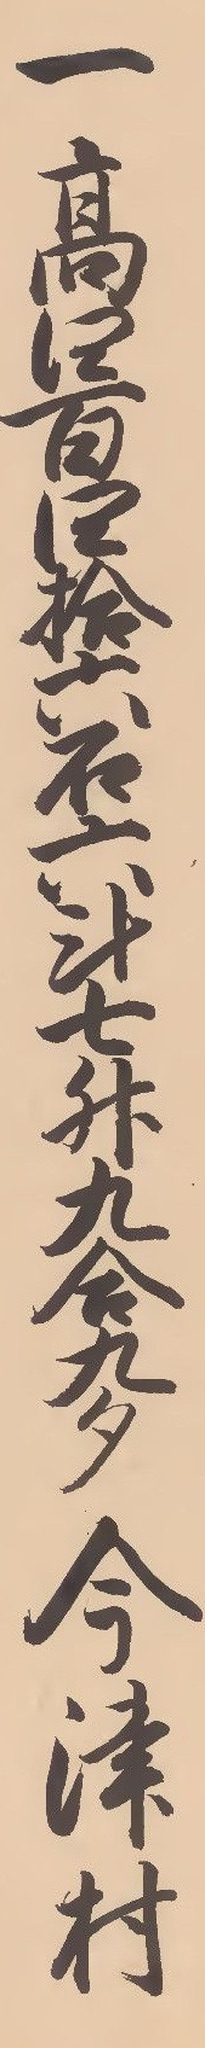一高四百四拾六石六斗七升九合九勺今津村

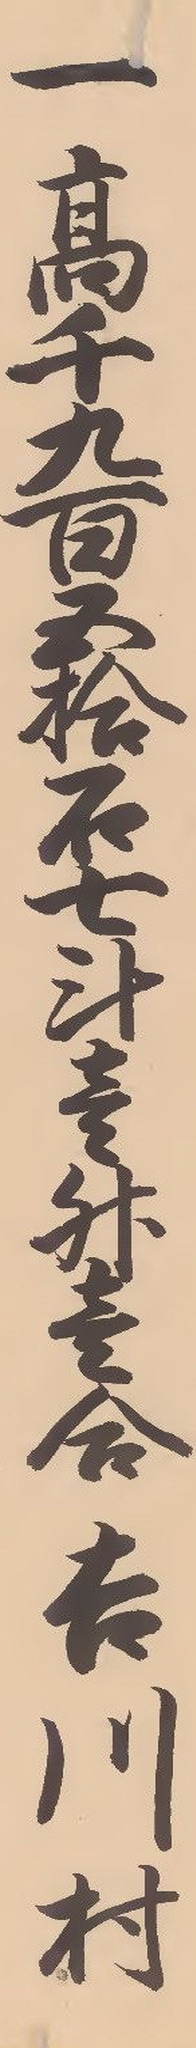一高千九百五拾石七斗壱升壱合吉川村
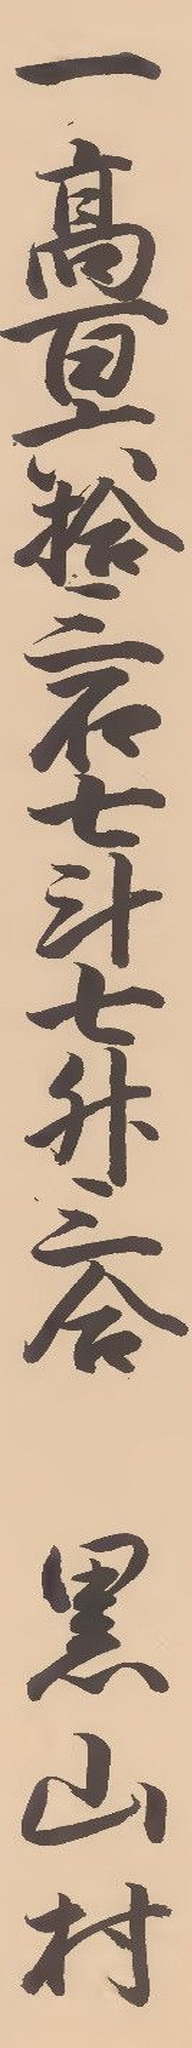一高百六拾三石七斗七升三合黒山村
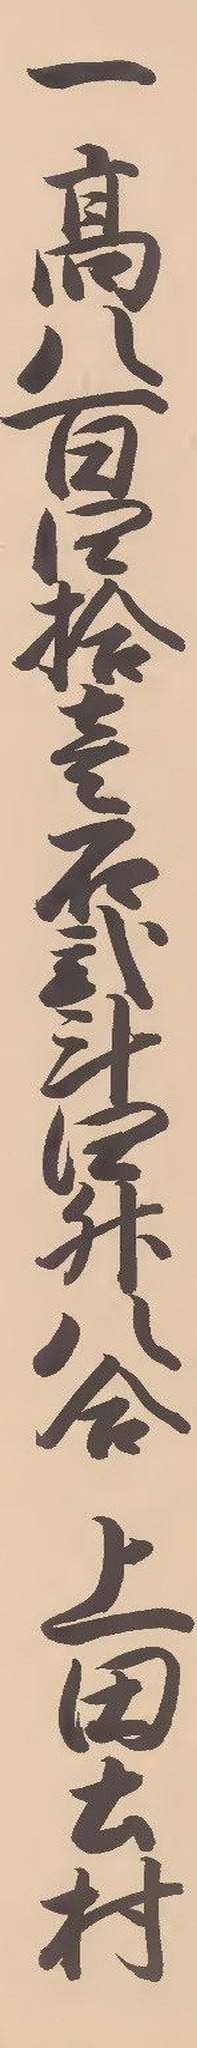一高八百四拾壱石弐斗四升八合上田土村
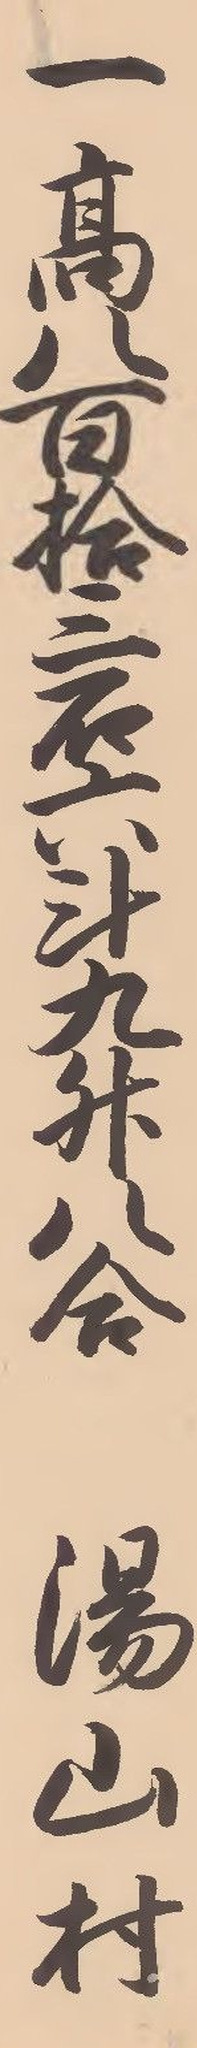一高八百拾三石六斗九升八合湯山村
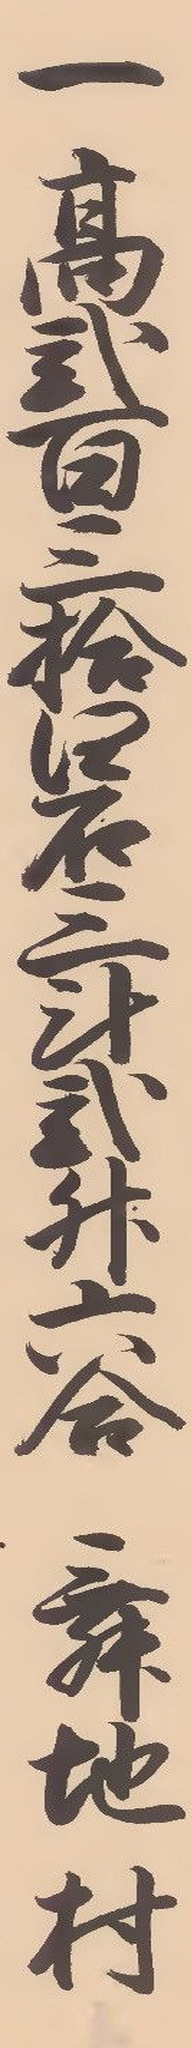一高弐百三拾四石三斗弐升六合舞地村
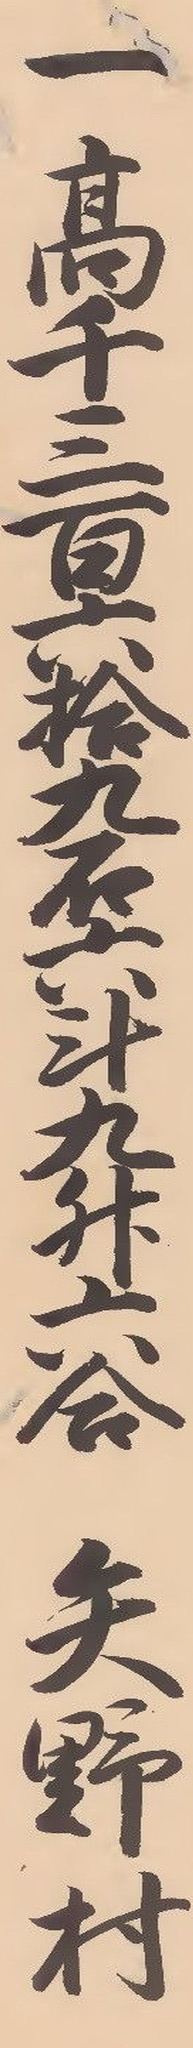一高千三百六拾九石六斗九升六合矢野村

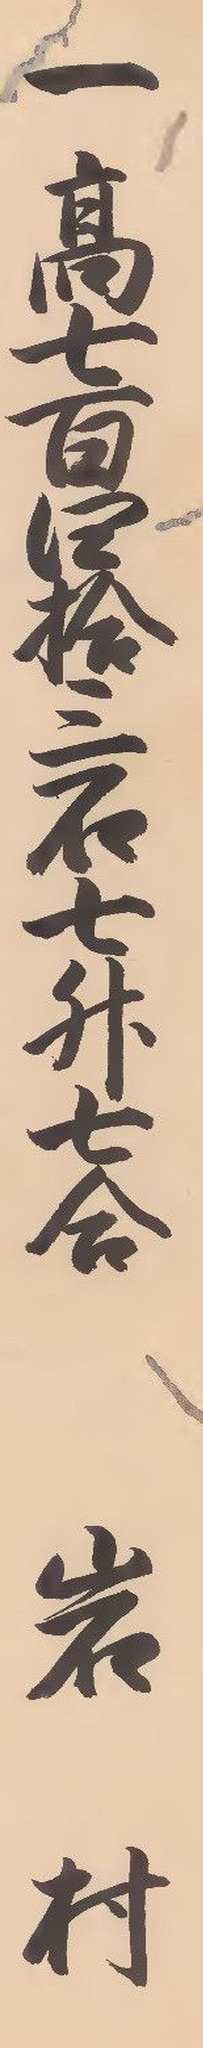一高七百四拾三石七升七合岩村
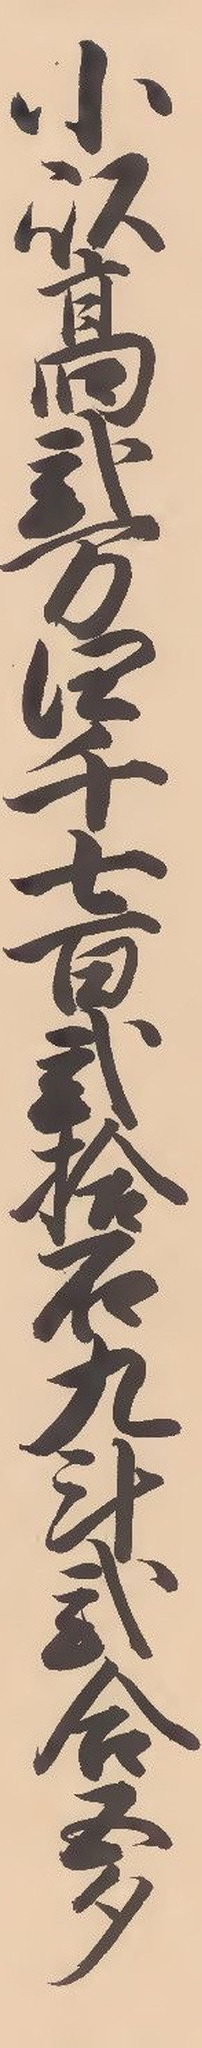小以高弐万四千七百弐拾石九斗弐合五勺
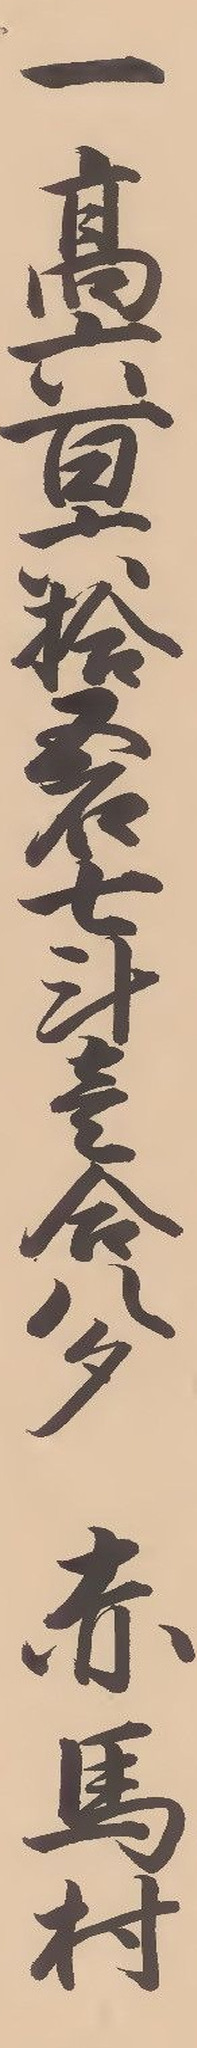一高六百六拾五石七斗壱合八勺赤馬村
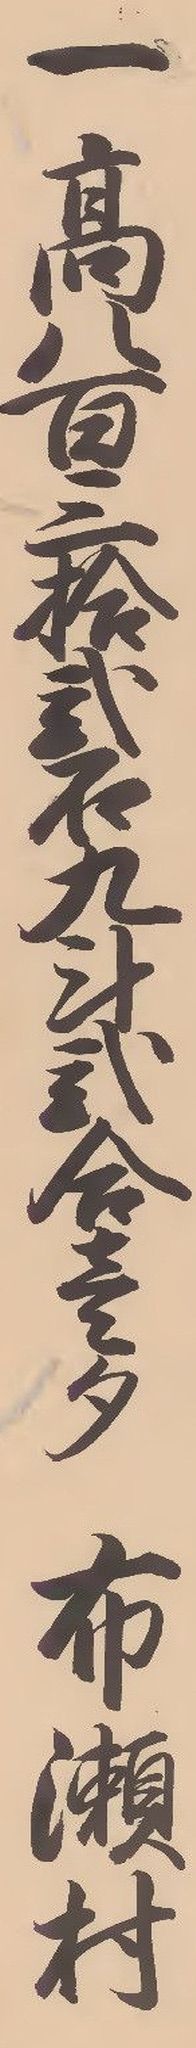一高八百三拾弐石九斗弐合壱勺布瀬村

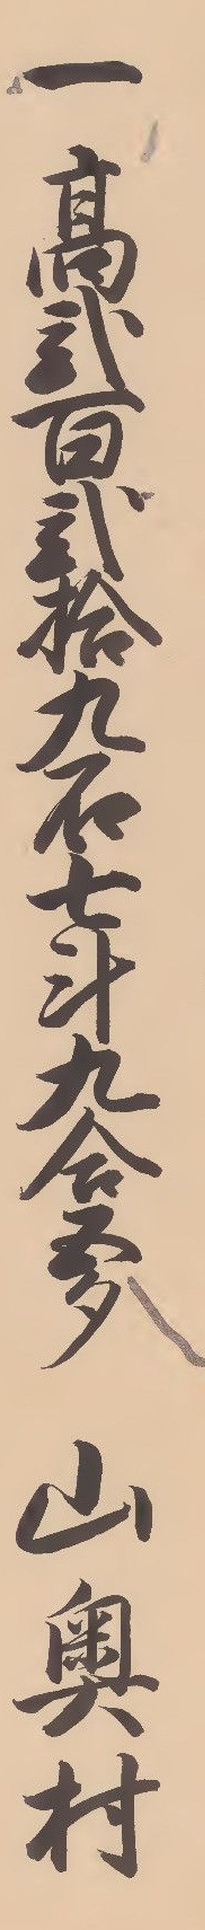一高弐百弐拾九石七斗九合五勺山奥村
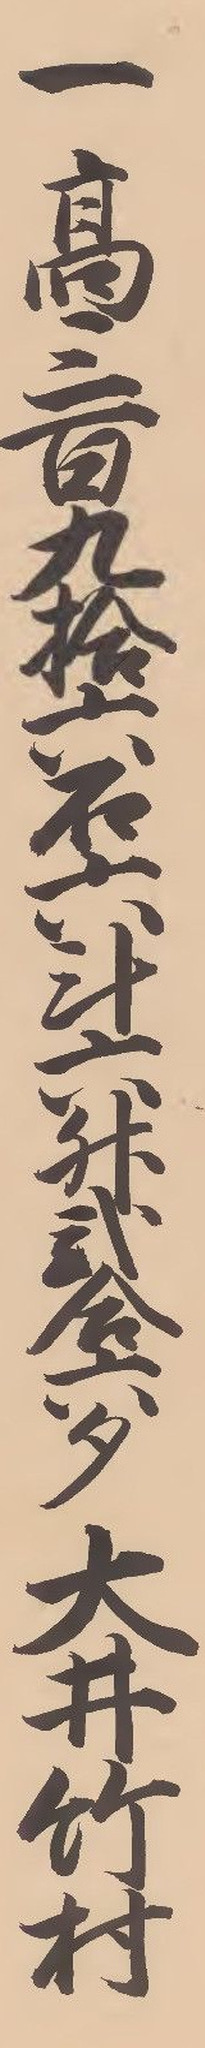一高三百九拾六石六斗六升弐合六勺大井竹村
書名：備中国郷帳
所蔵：国立公文書館 National Archives of Japan
